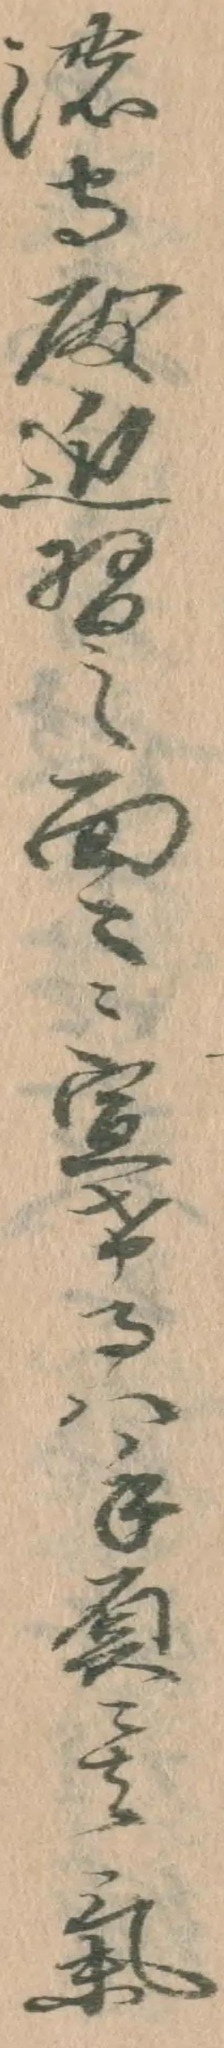濃守殿近習之面々に宣希るは手負に者気
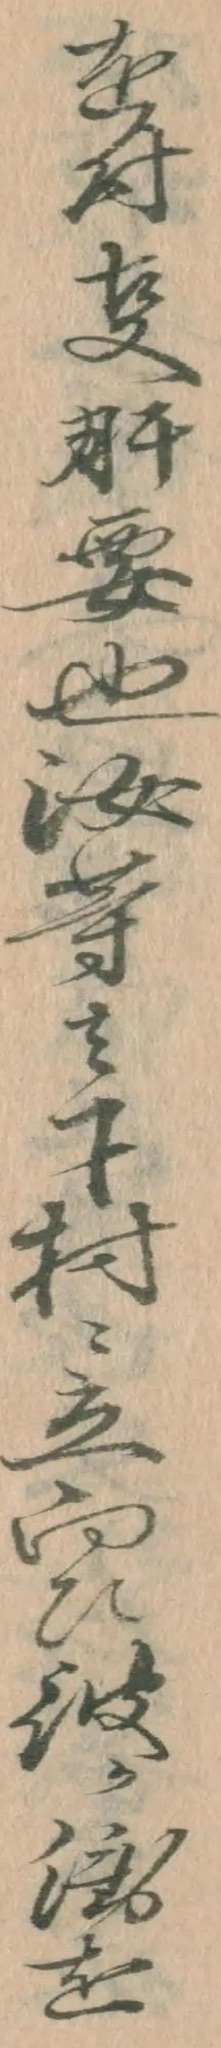を付事肝要也汝等者下村に立向ひ彼か働を
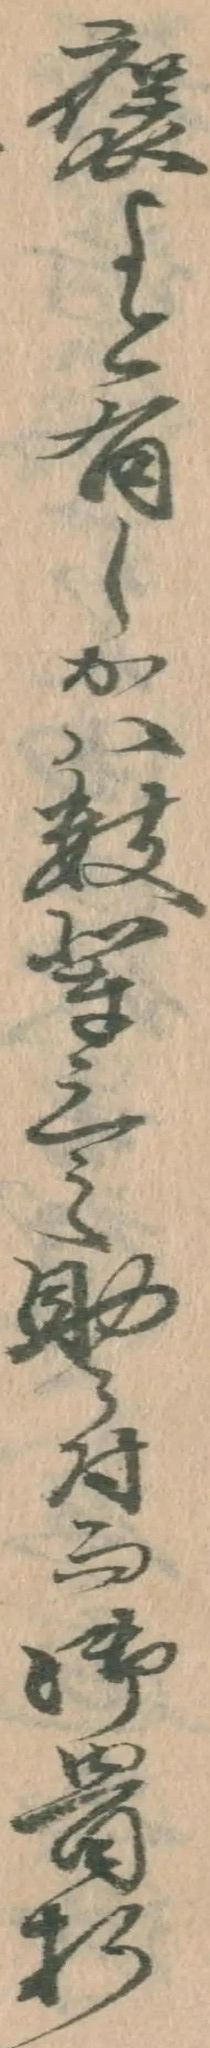褒よと有しかは数輩三之助に付而御骨折
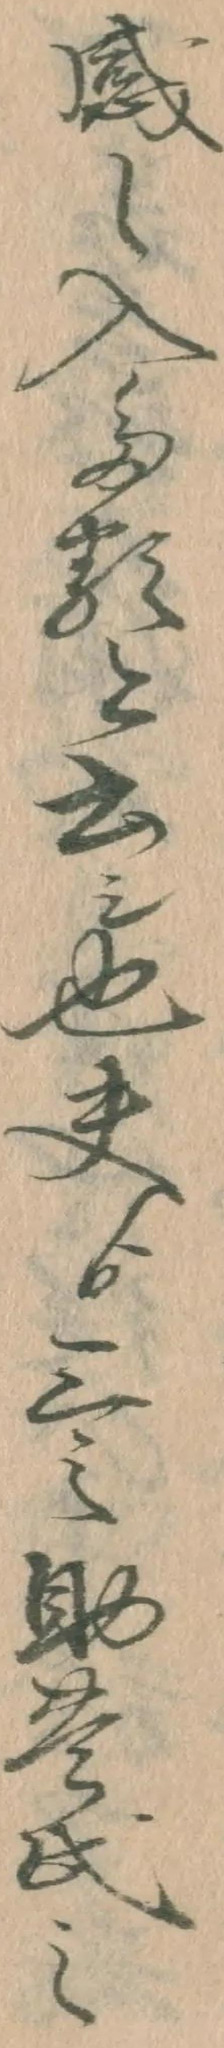感し入多類と云し也夫ゟ三之助豊氏之
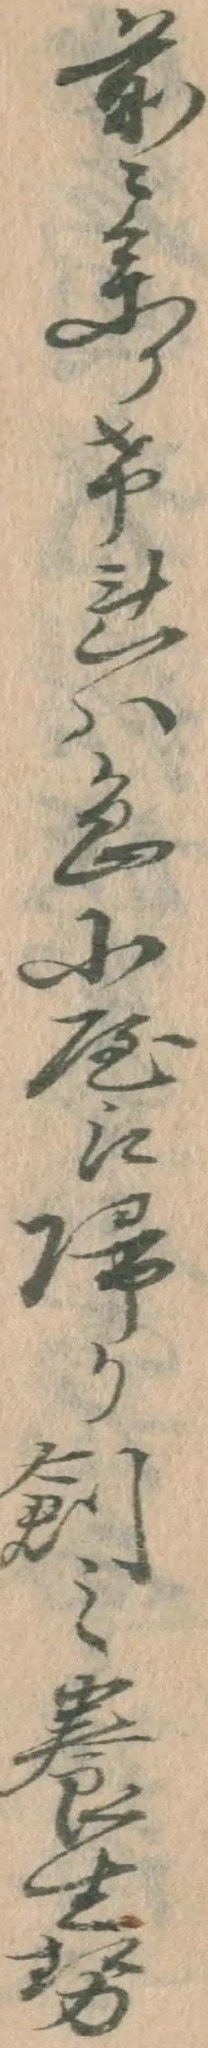前に参り希連は急小屋江帰り創之養生勢
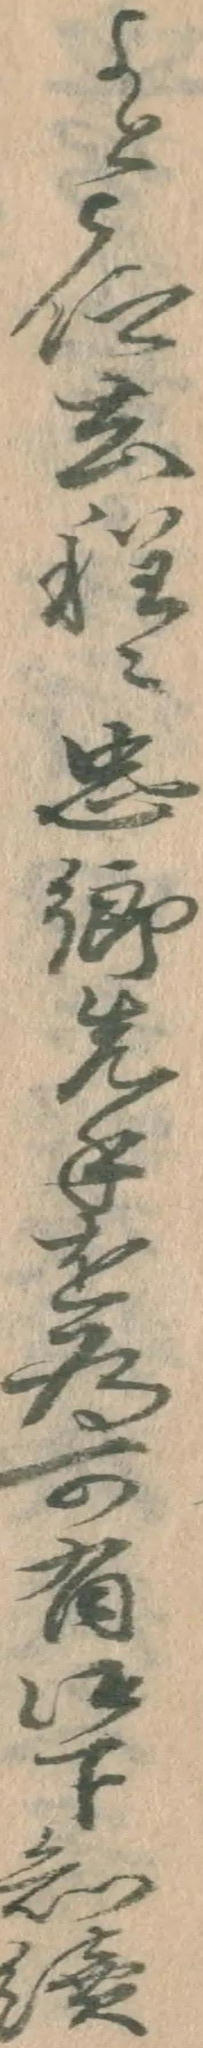よと被仰去程に忠郷先手を為可有御下知続
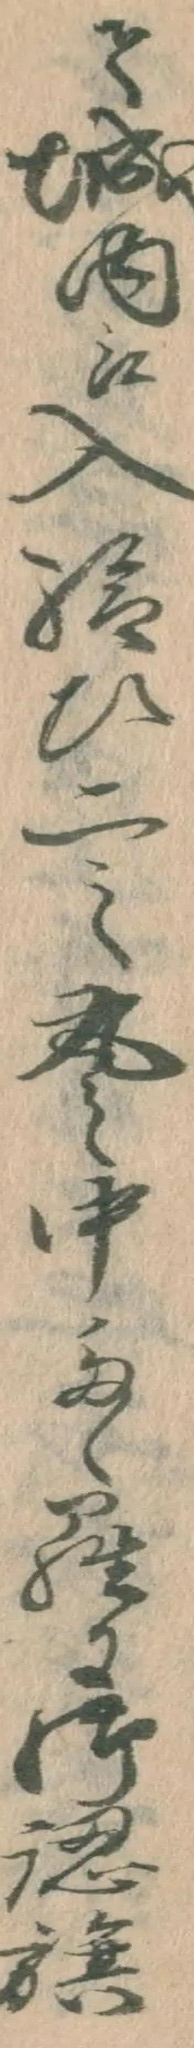て城内江入給ひ二之丸之中多々羅尓御認旗
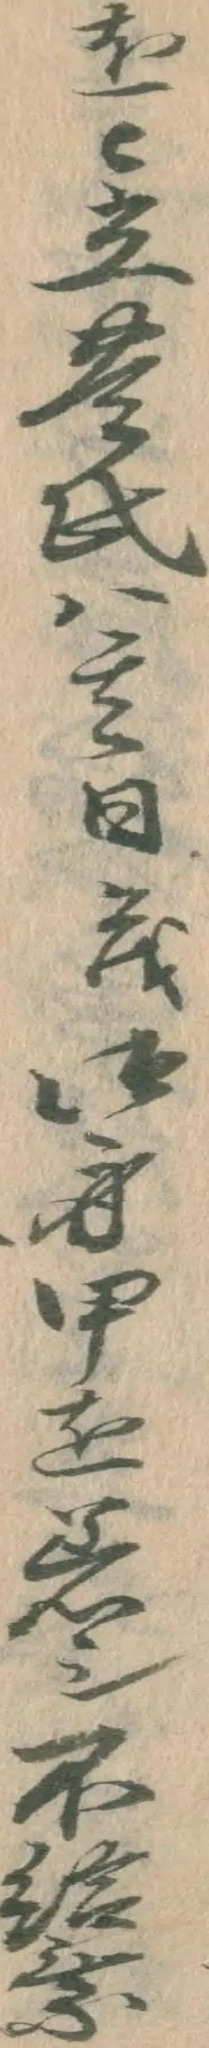を被立豊氏は其日茂御身甲を着し不結乗
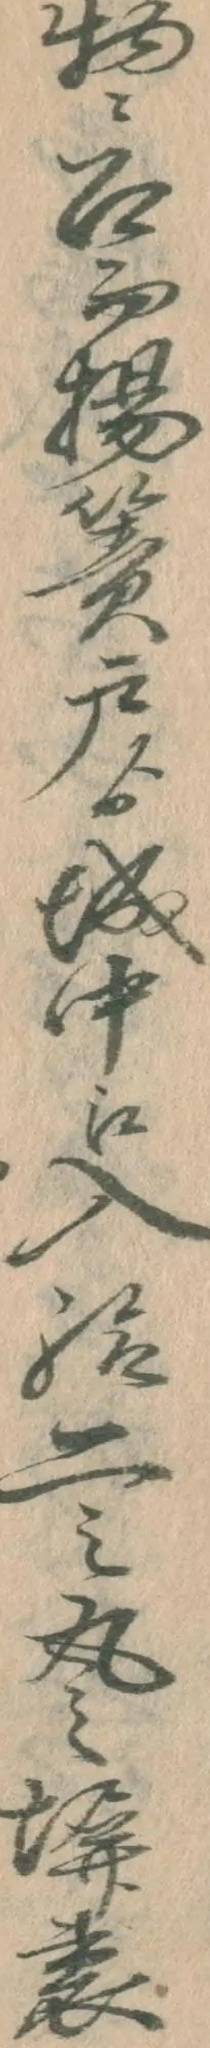物に召而揚箕戸ゟ城中江入給二之丸之塀裏
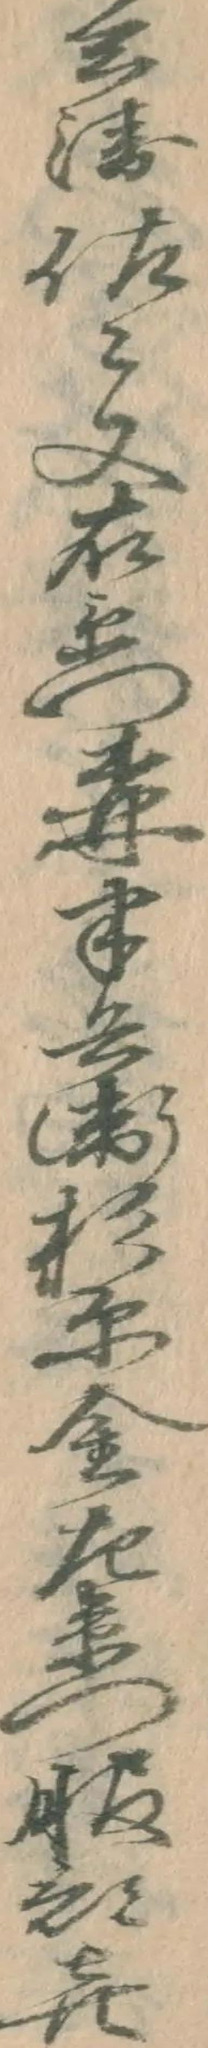兵衛佐々又右衛門梅半兵衛杉原金左衛門服部喜

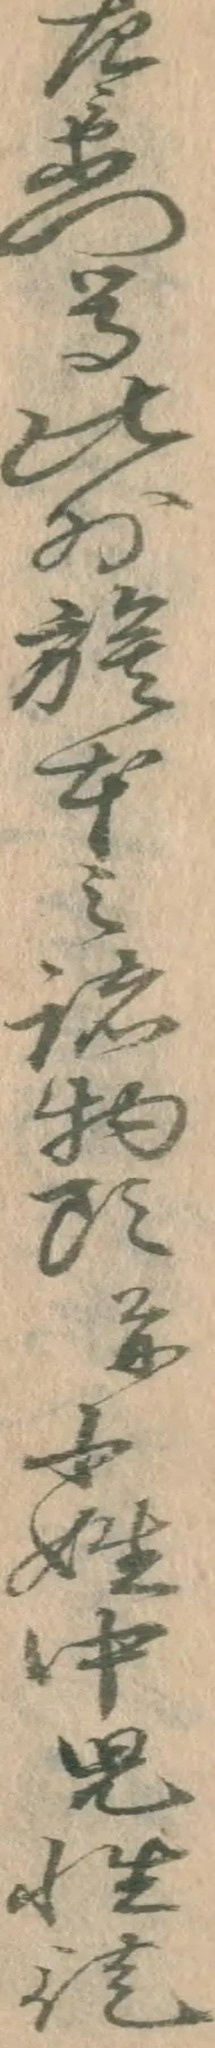左衛門等此外旗本之諸物頭幷小姓中児性徒
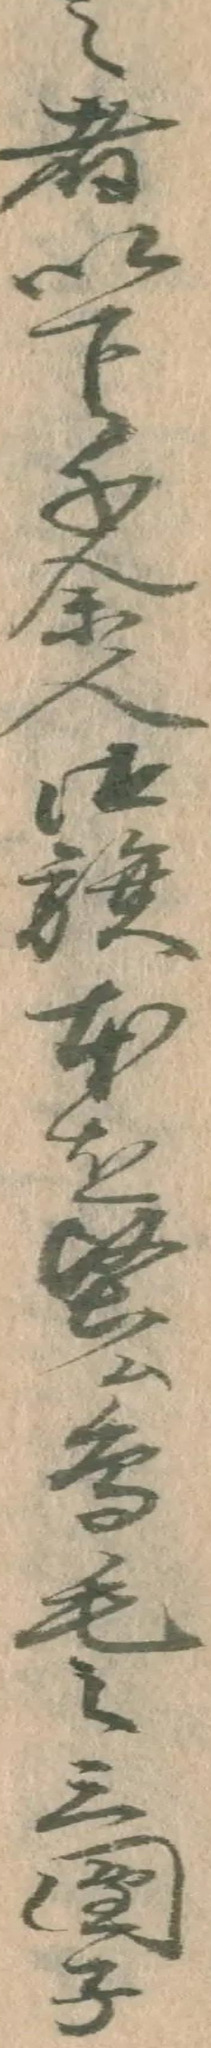之者入可千余人御旗本を堅む鳥毛之三団子
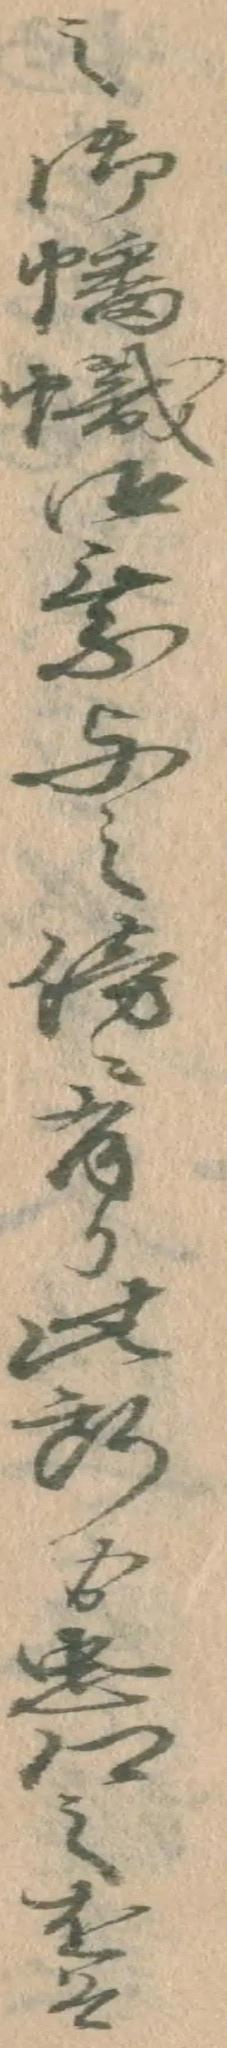之御幡幟御乗与之傍に有り此所ゟ忠郷之をは
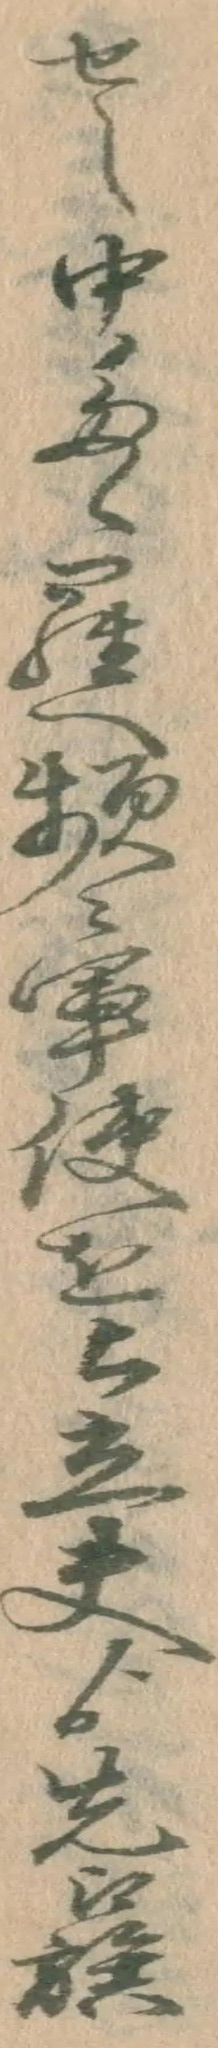せし中多々羅へ頻に軍使を被立夫ゟ先江旗
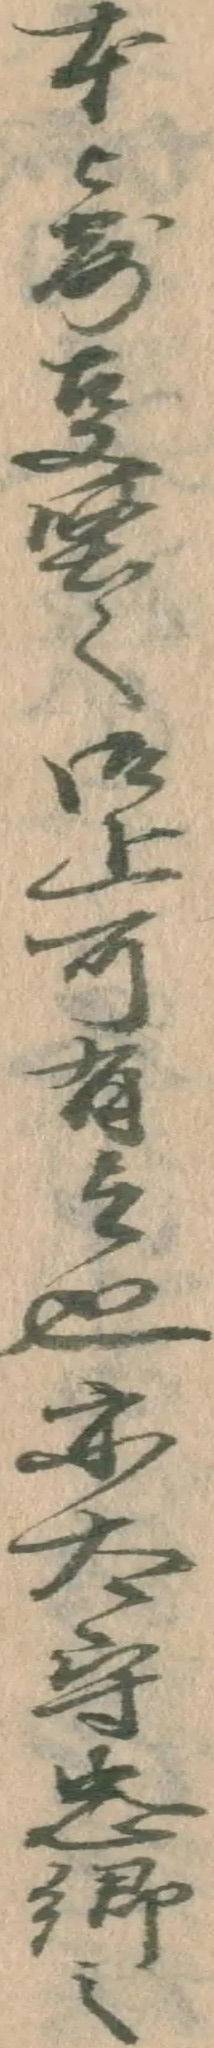本被寄事堅く御上可有与也亦太守忠郷之
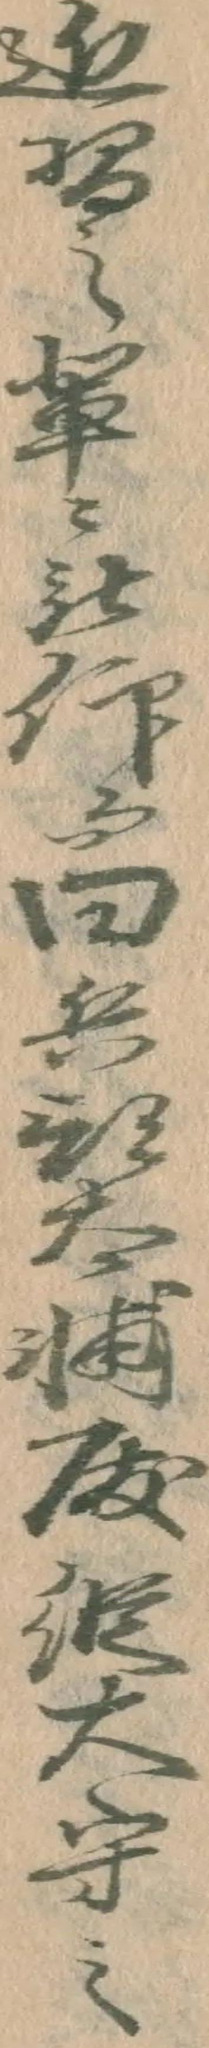近習之輩に被仰而曰兵部太輔殿縦大守之
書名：切支丹御退治記 49巻. [8]
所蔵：国立国会図書館 National Diet Library, JAPAN
